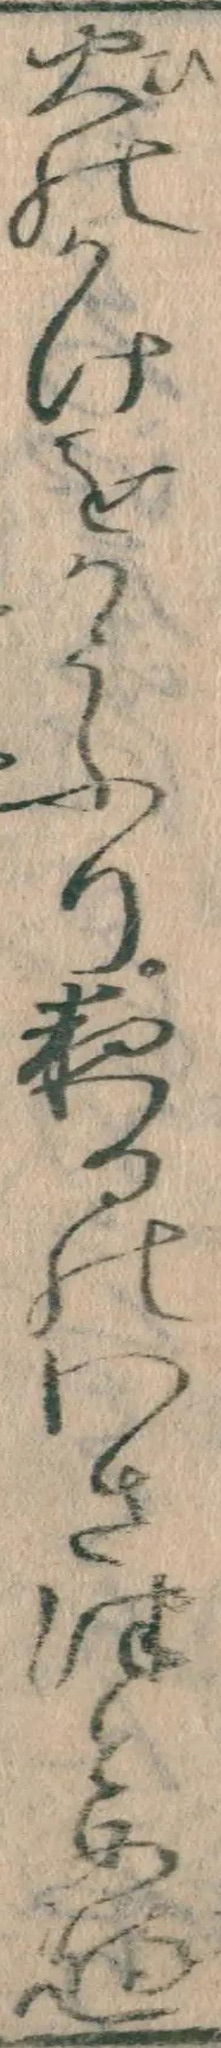火のかけをかうふり。夜るのわさつとめ侍ん
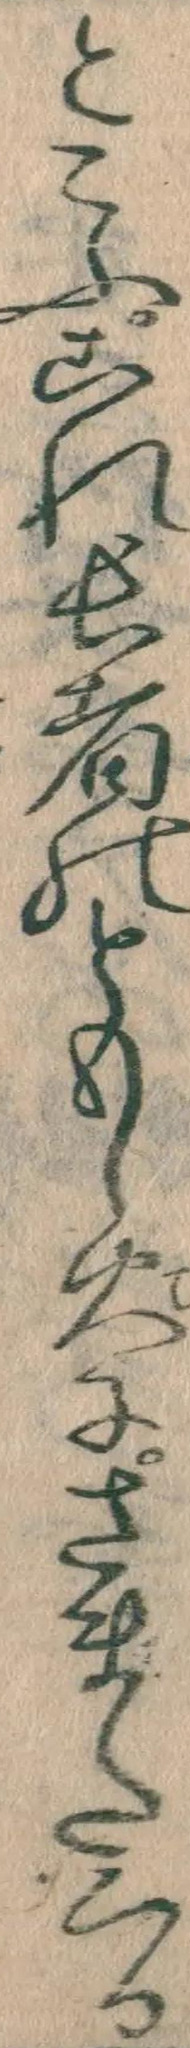とこふ。これ長者のともし火に。さまたくる
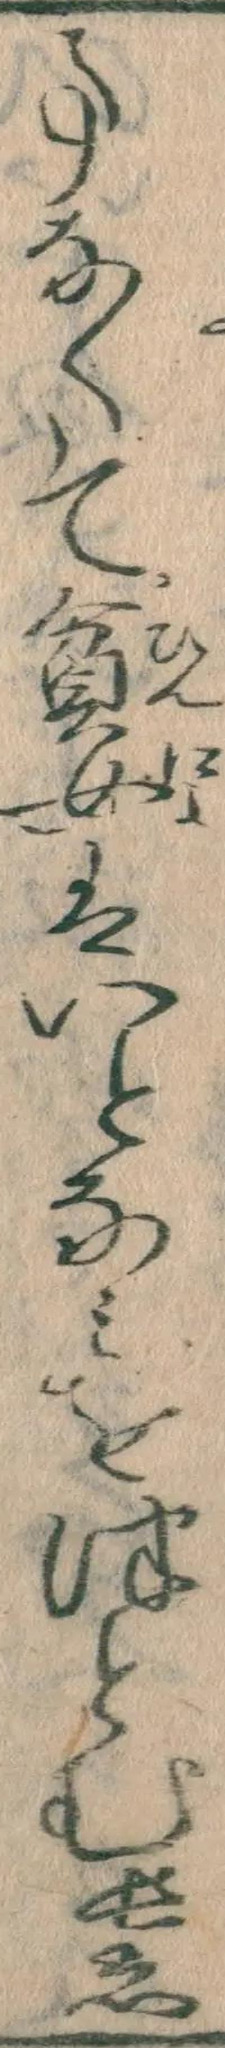事なくて。貧女はいとなみをつとむ長者
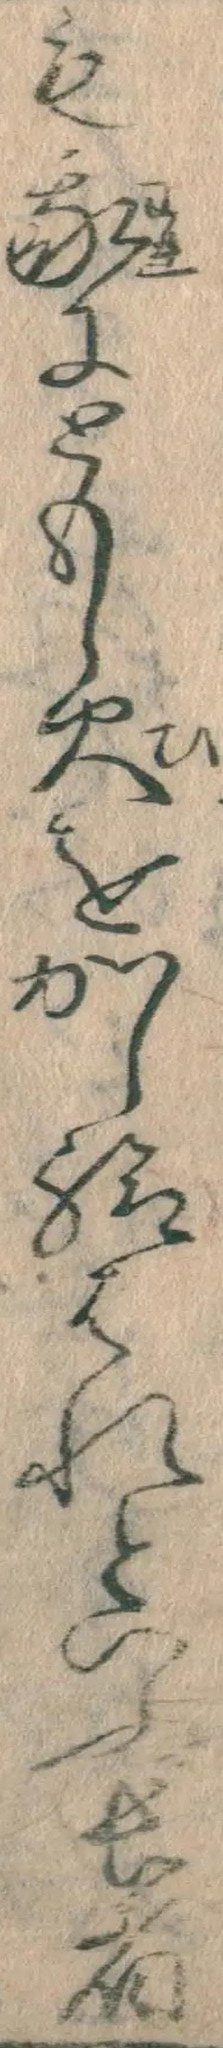も我にともし火をかし給はれといふ。長者
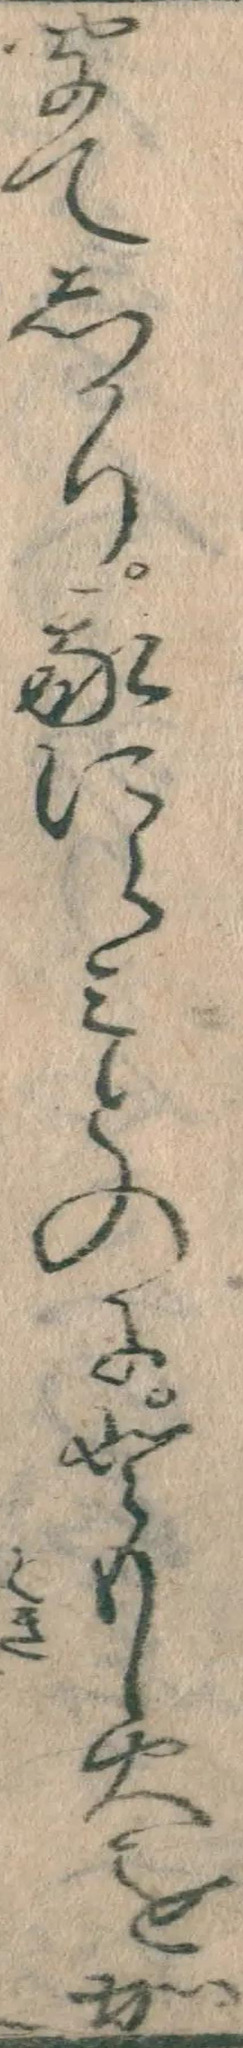聞てしかり。我にらみとのに。ともし火をか
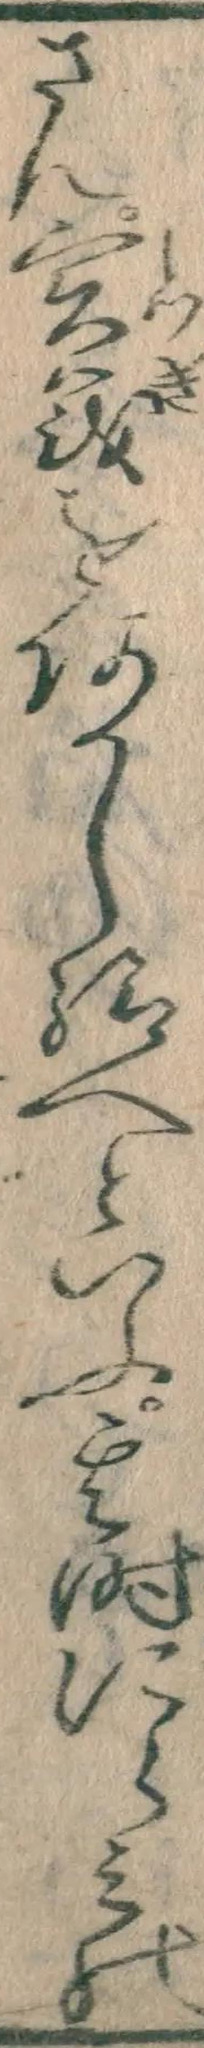さん。実義をあかし給へといふ。其時にらみの
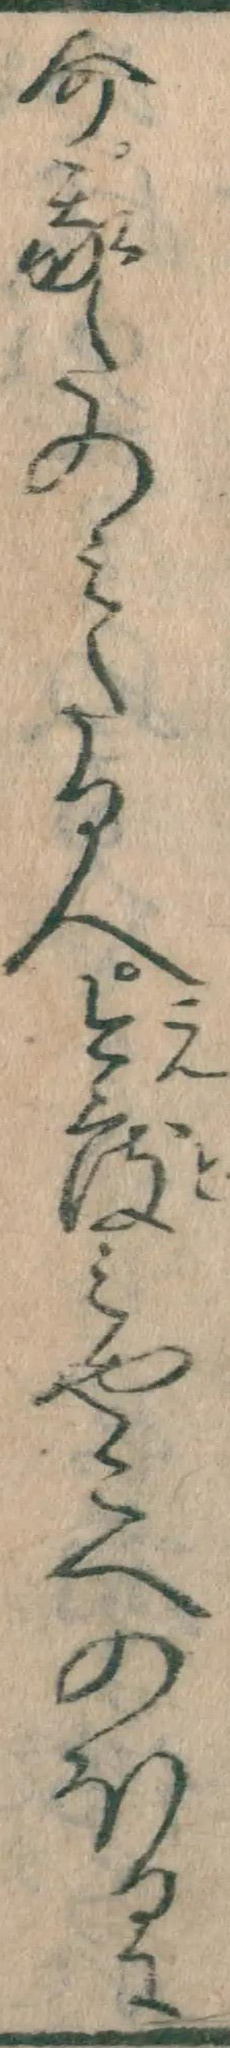すけ。我たのみたる人。今度みやこへのほるに

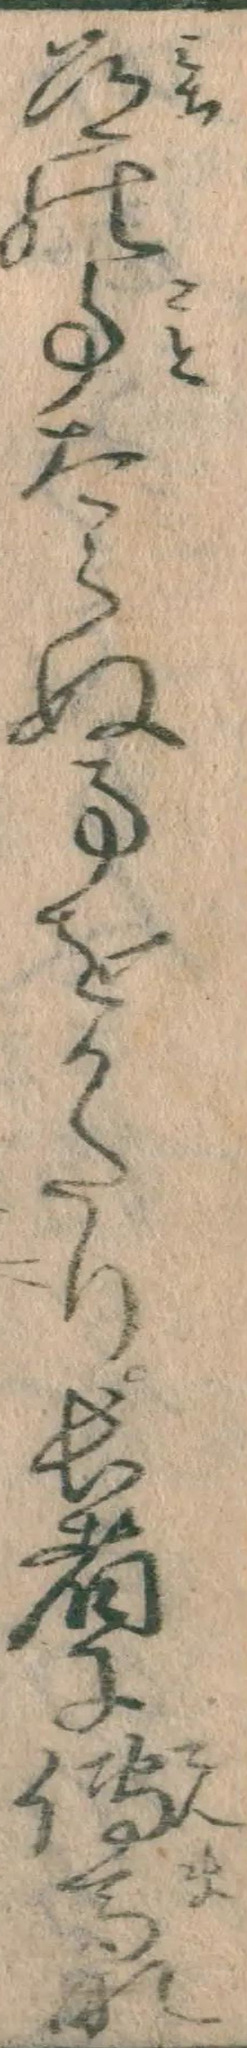道の事たらぬ事をかたり長者に伝馬な
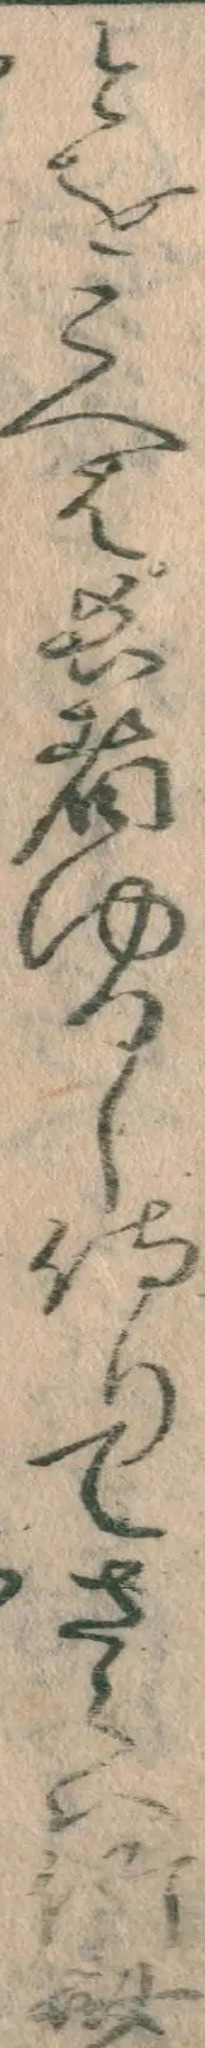とをこへは。長者ゆるし侍りてさらは竹斎
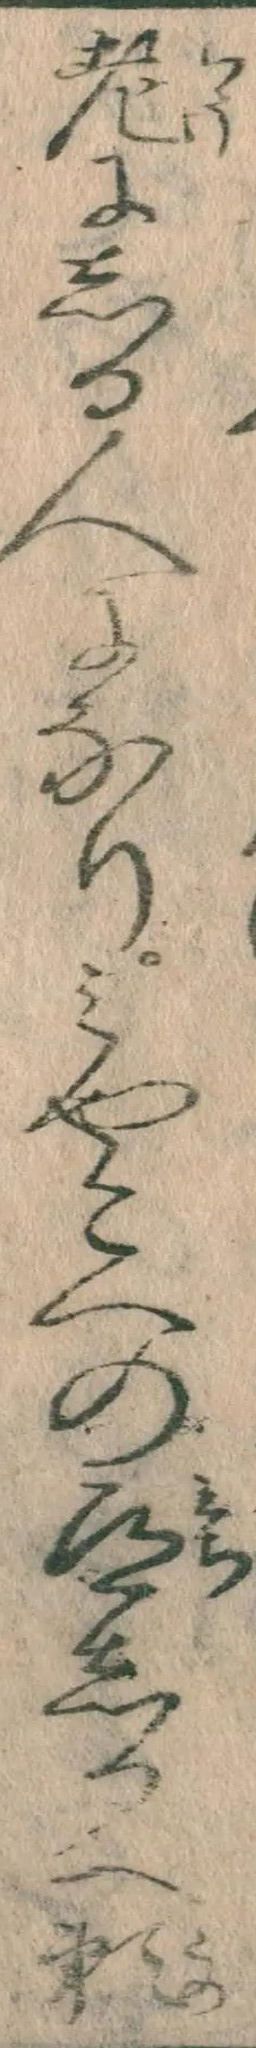老にしる人になり。みやこへの道しるへ頼
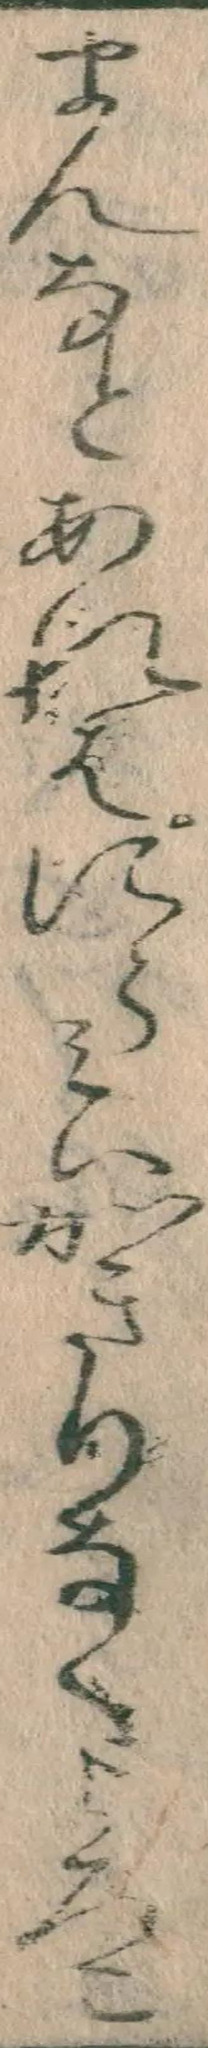まんなとあれは。にらにはまきりなくよろこ
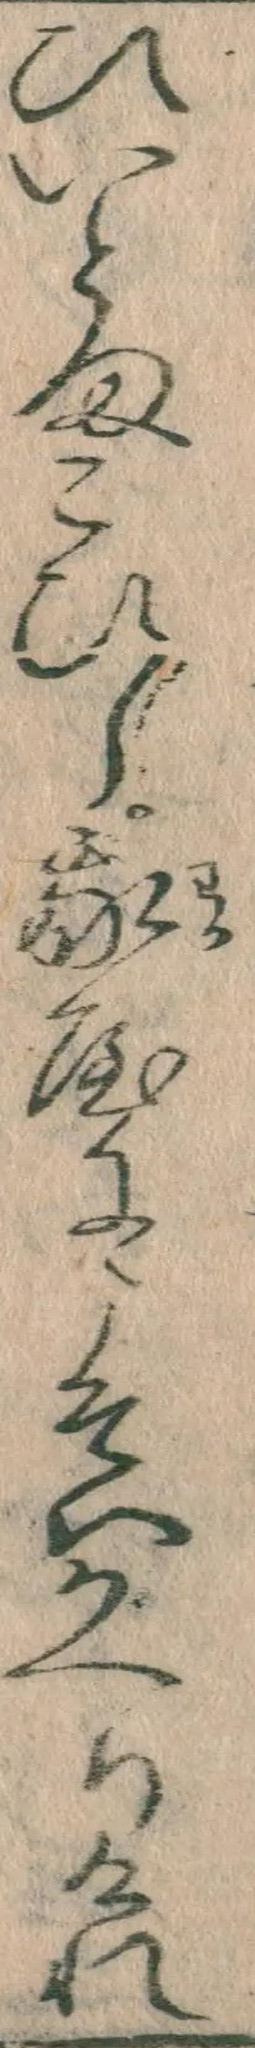ひいとまこひし。我屋にこそはかへりけれ
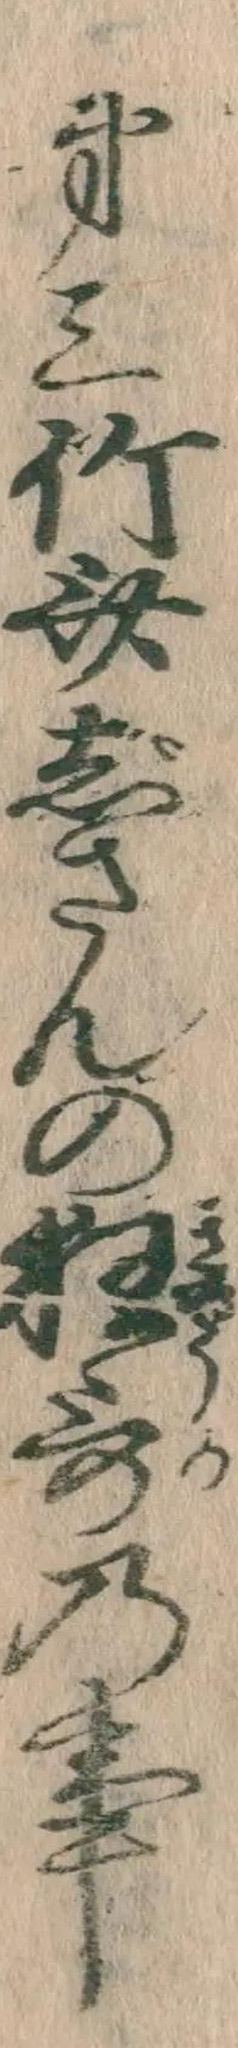第三竹斎じさんの狂哥の事
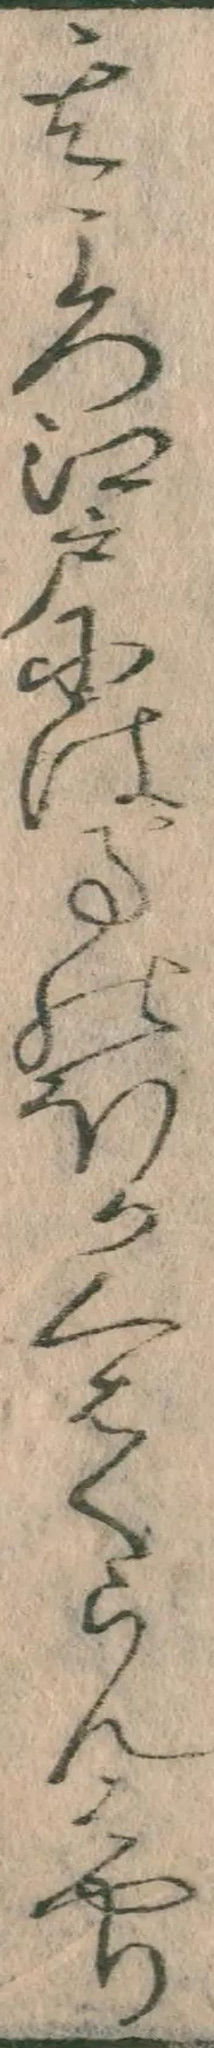其ころ江戸には。事のほかくはくらんはやり
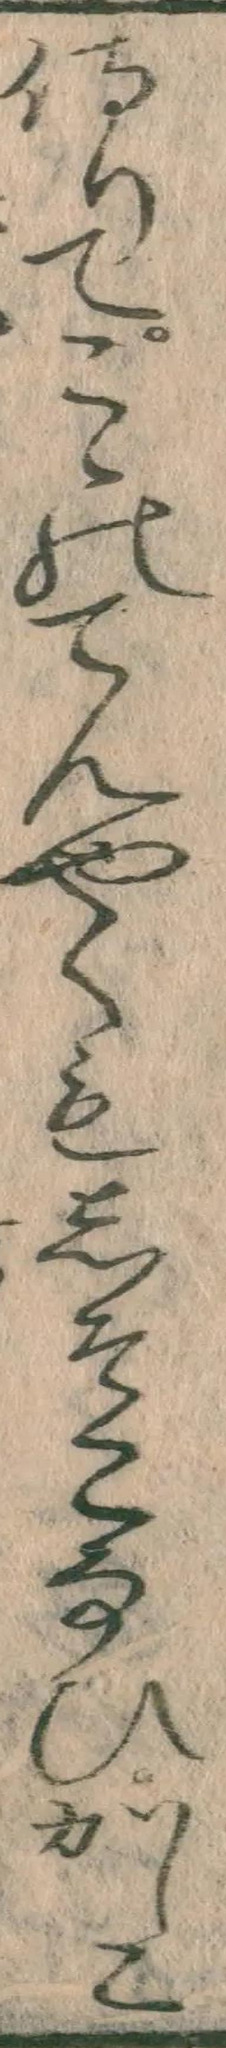侍りて。こゝのてんやくもしそこなひ。かしこ
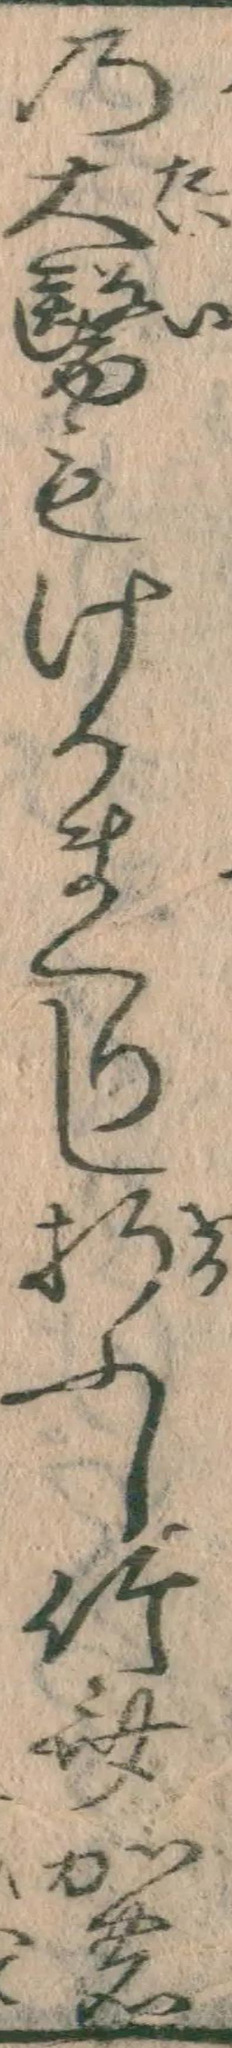の大医もけりまくりし折ふし。竹斎かの
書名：竹斎狂歌物語 3巻
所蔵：国立国会図書館 National Diet Library, JAPAN
